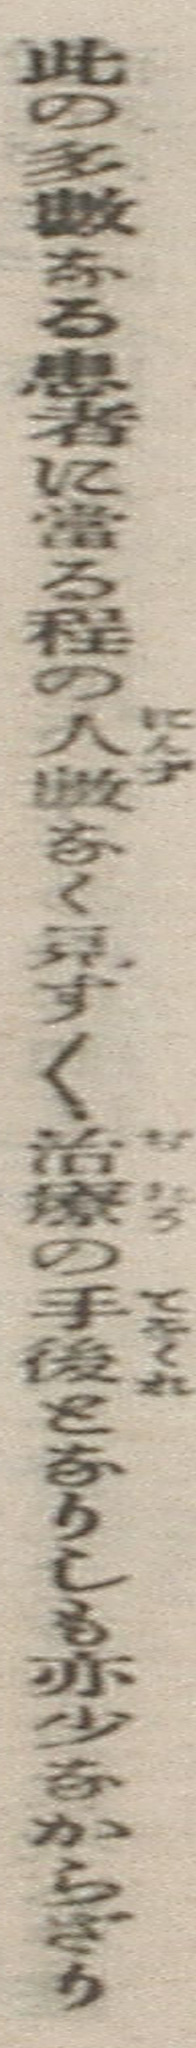此の多数なる患者に当る程の人数なく見す〳〵治療の手後となりしも亦少なからざり

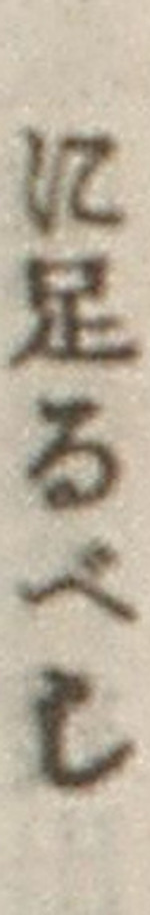に足るべし

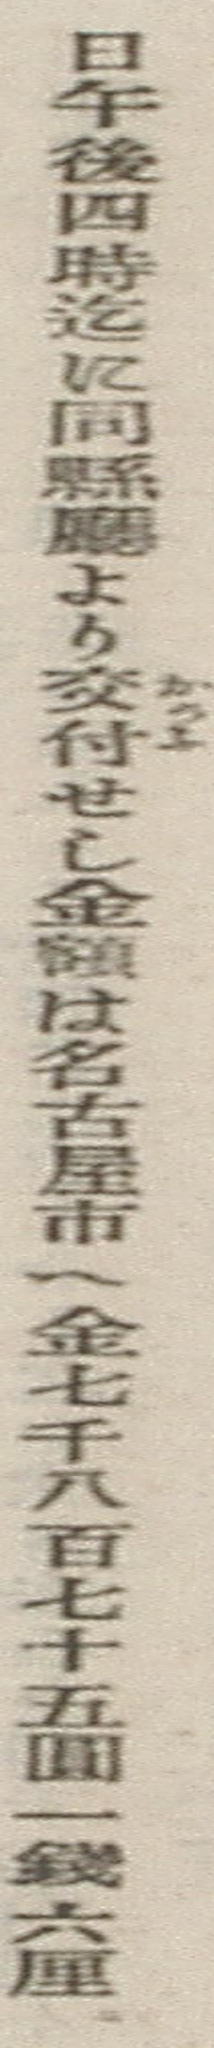日午後四時迄に同県庁より交付かうふせし金額は名古屋市へ金七千八百七十五円一銭六厘、
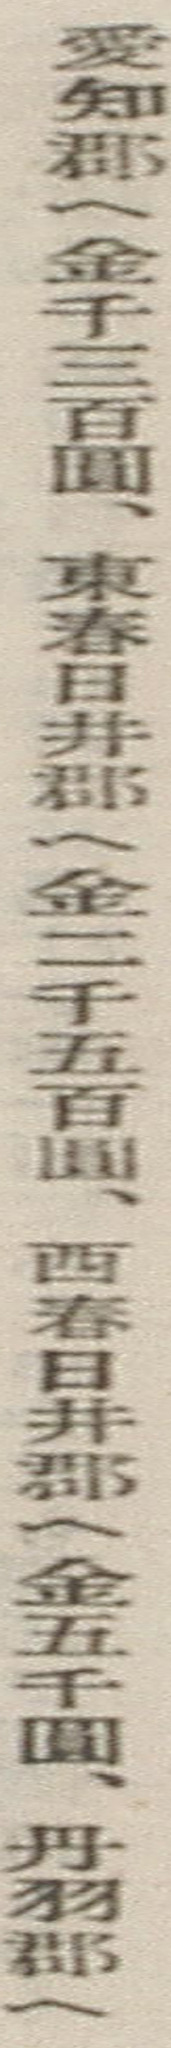愛知郡へ金千三百円、東春日井郡へ金二千五百円、西春日井郡へ金五千円、丹羽郡へ
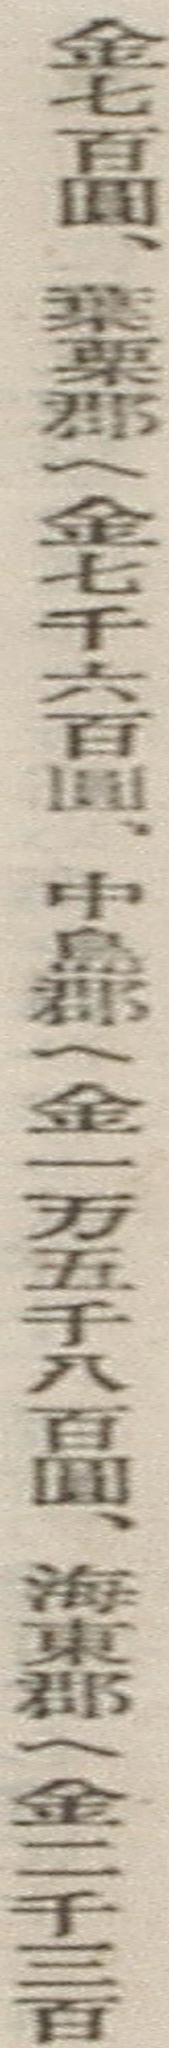金七百円、葉栗郡へ金七千六百円、中島郡へ金一万五千八百円、海東郡へ金二千三百
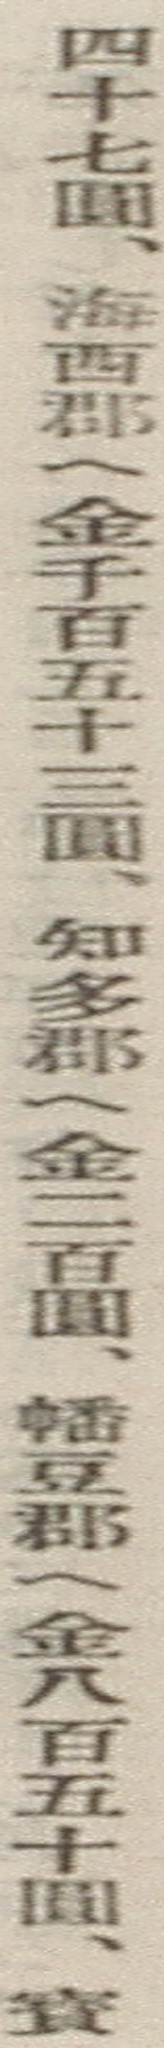四十七円、海西郡へ金千百五十三円、知多郡へ金二百円、幡豆郡へ金八百五十円、寶
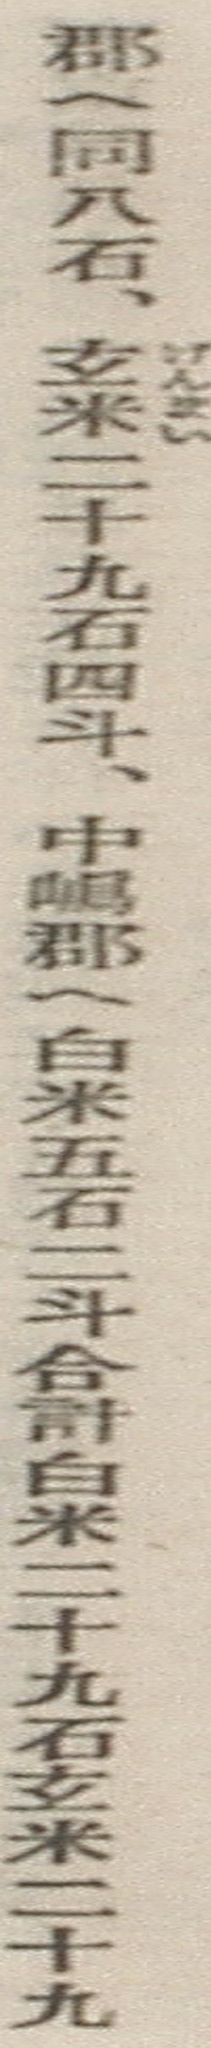郡へ同八石、玄米げんまい二十九石四斗、中嶋郡へ白米五石二斗合計白米二十九石玄米二十九
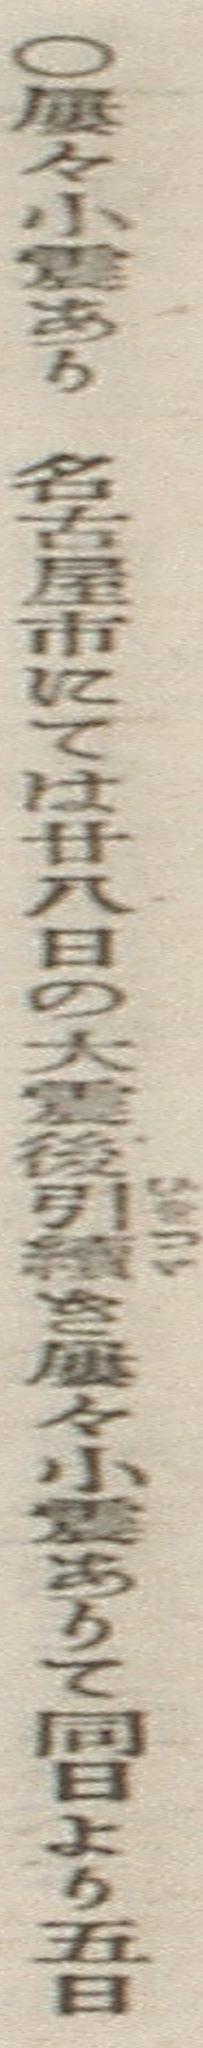〇屢々小震あり名古屋市にては廿八日の大震後引続ひきつヾき屢々小震ありて同日より五日

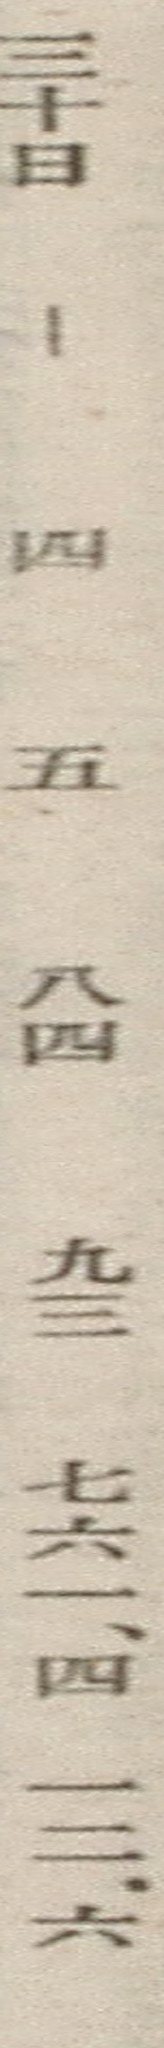三十日ー四五八四九三七六一、四一二、六
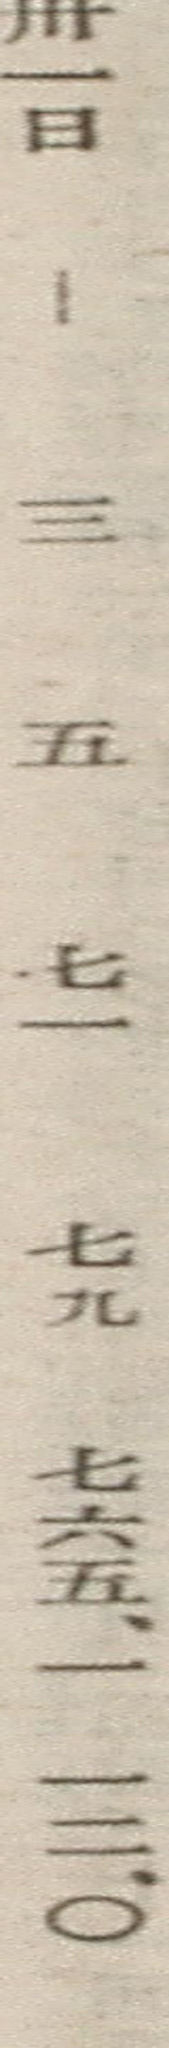卅一日ー三五七一七九七六五、一一二、〇
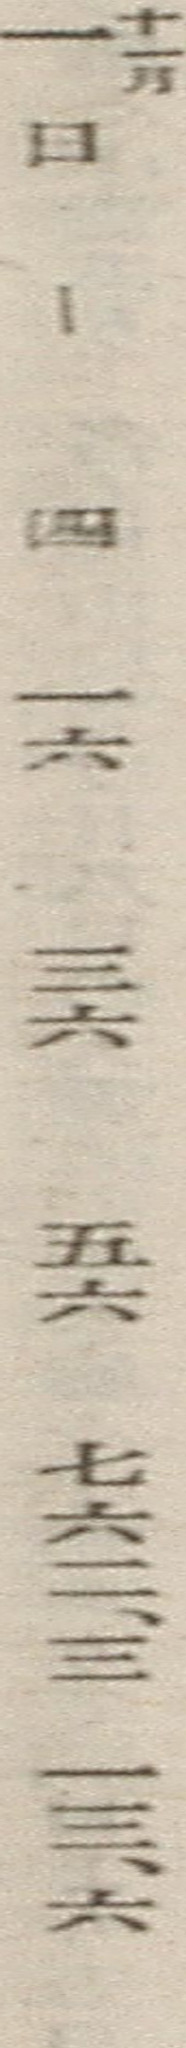一日ー四一六三六五六七六二、三一三、六
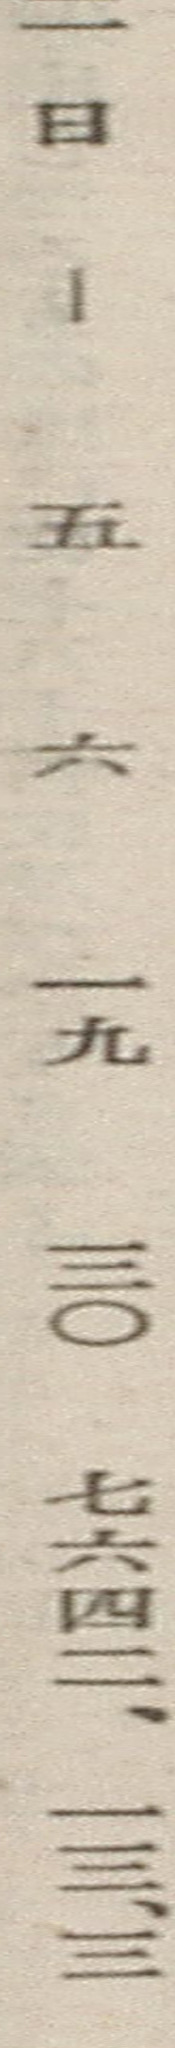二日ー五六一九三〇七六四二、一三、三
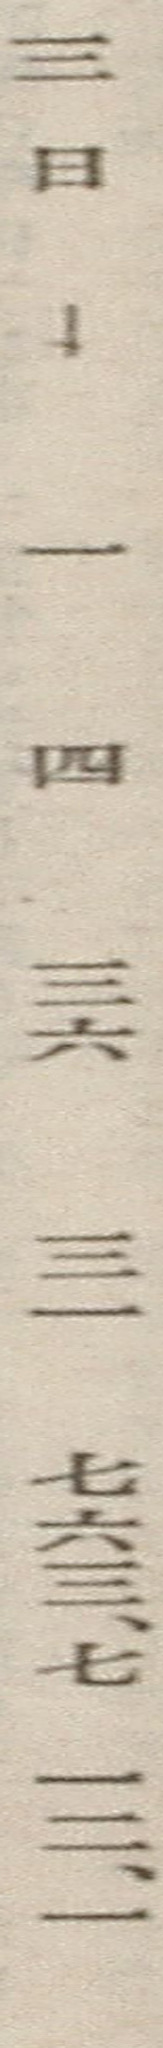三日ー一四三六三一七六三、七一二、一
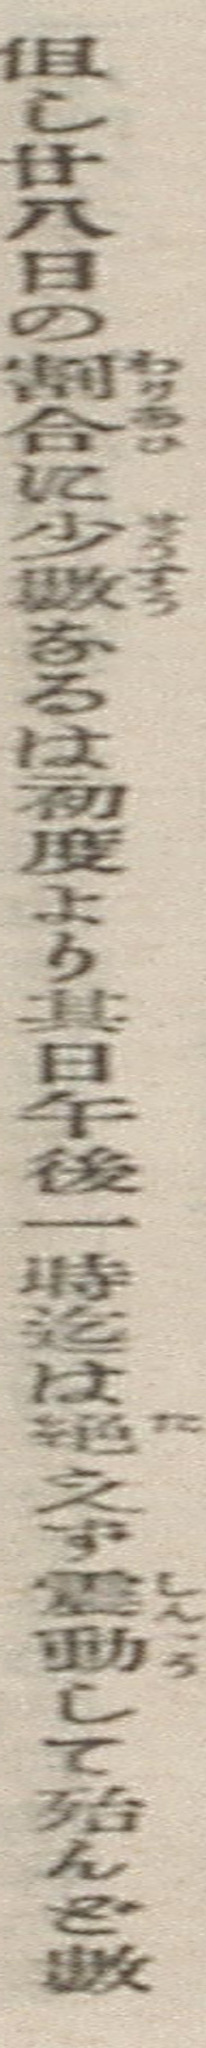但し廿八日の割合に少数なるは初度より其日午後一時迄は絶えず震動して殆んど数
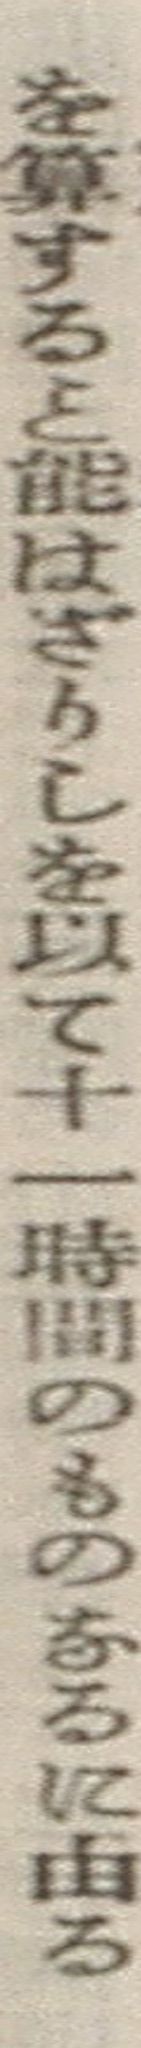を算すること能はざりしを以て十一時間のものなるに由る
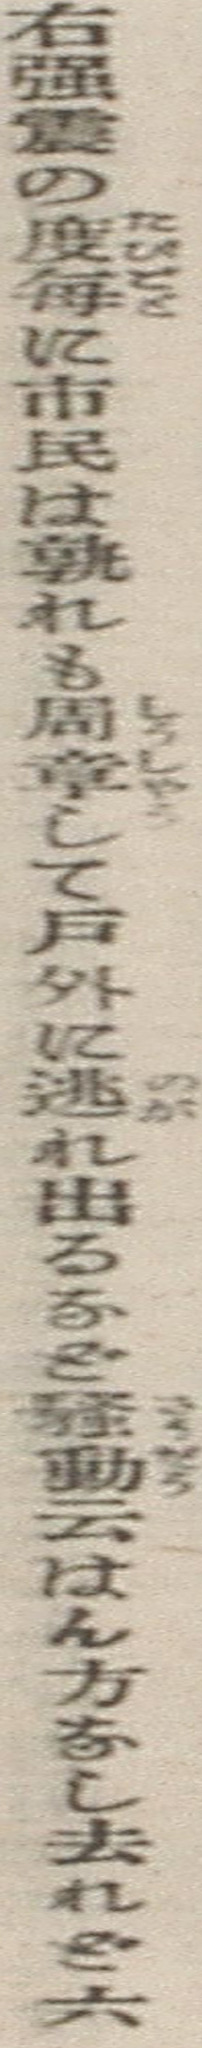右強震の度毎に市民は孰れも周章して戸外に逃れ出るなど騒動云はん方なし去れど六
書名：愛知岐阜福井三県　大地震見聞録（内題）
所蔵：東京大学地震研究所図書室 Earthquake Research Institute Library, The University of Tokyo, JAPAN
